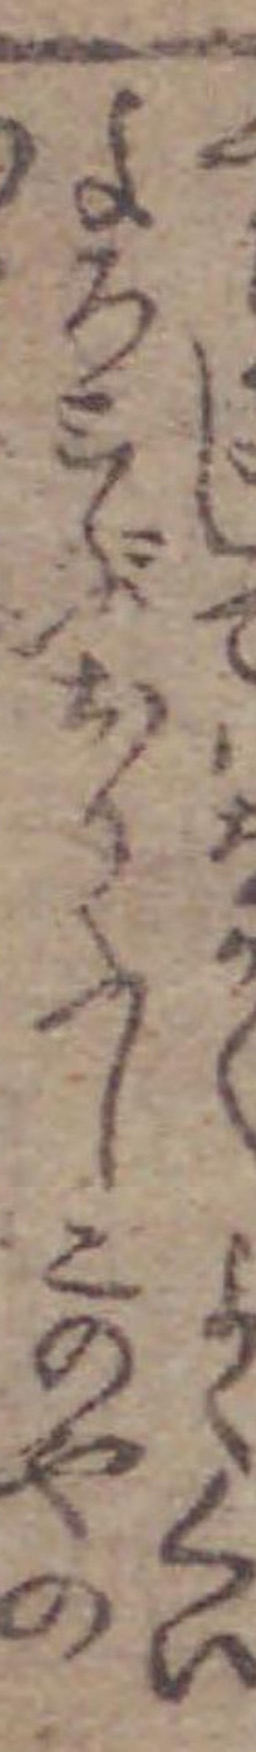よろこぶおりふしこのやの
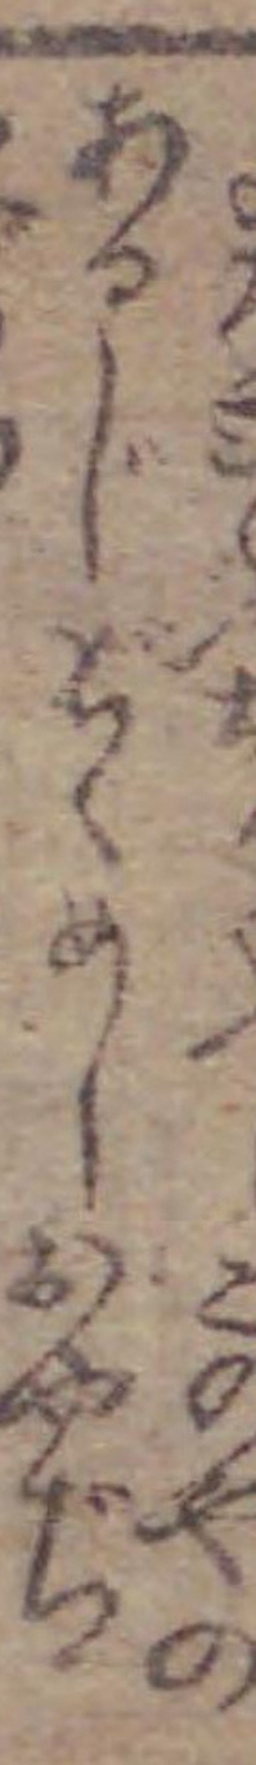あるじぢゝめしおやぢ
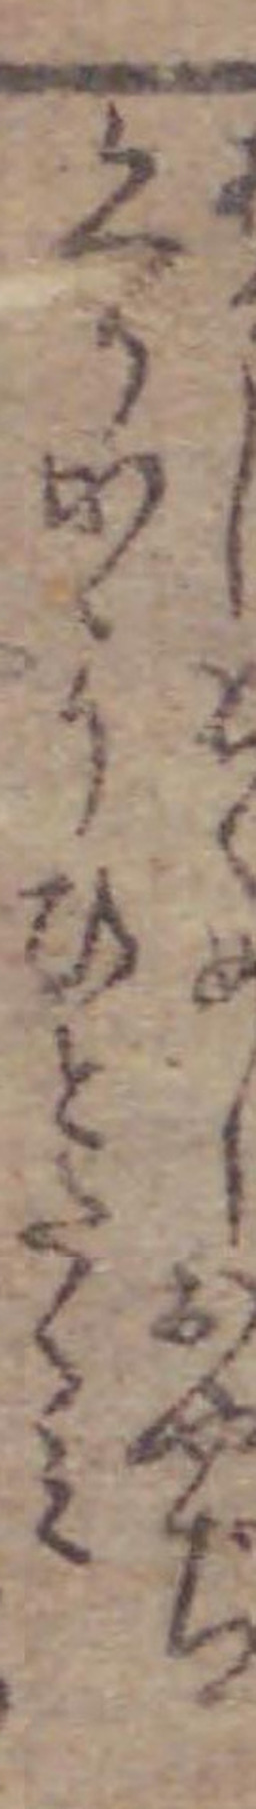かへりかゝりひとたくみ

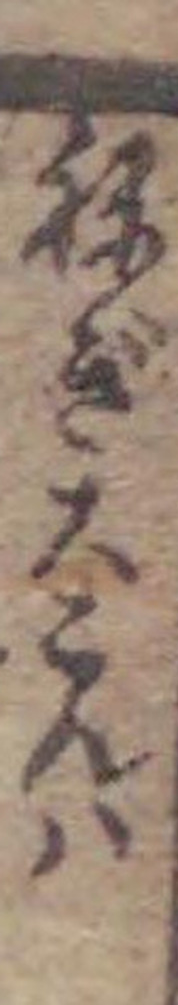ねぎ大こんは
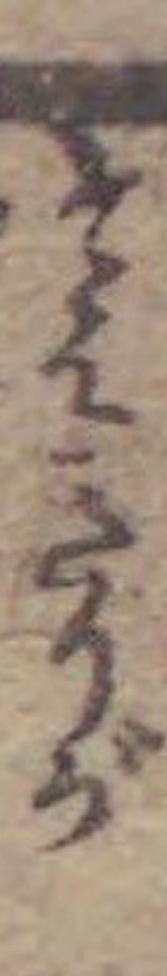そはきりが
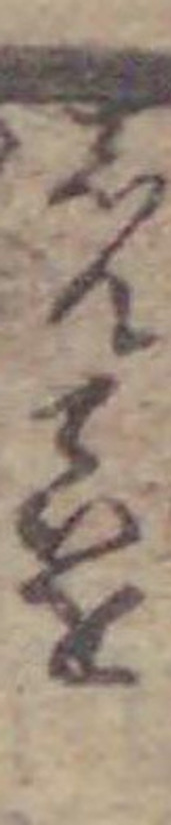しんていを
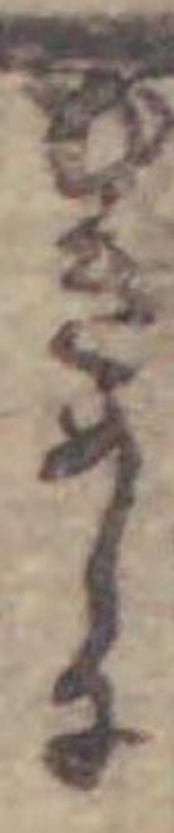むぎめしに
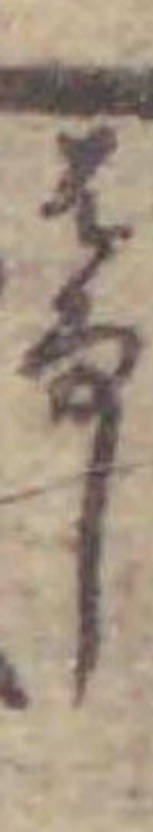はなし
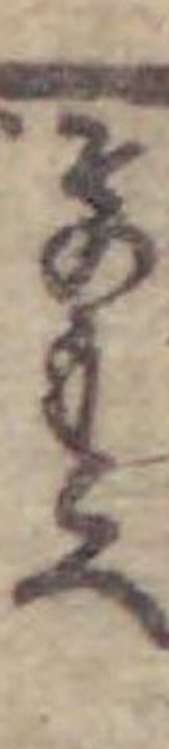そのもとへ
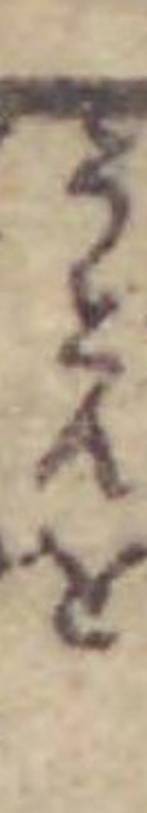うどんを
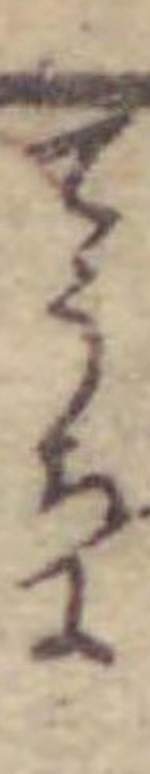てうちに
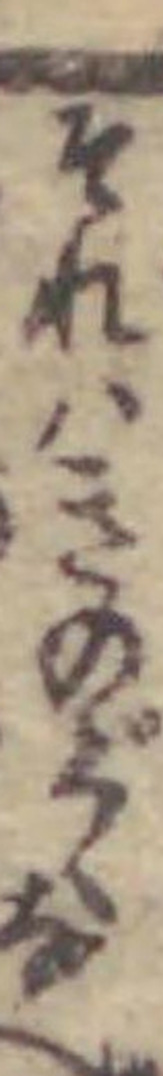それはきのどくな
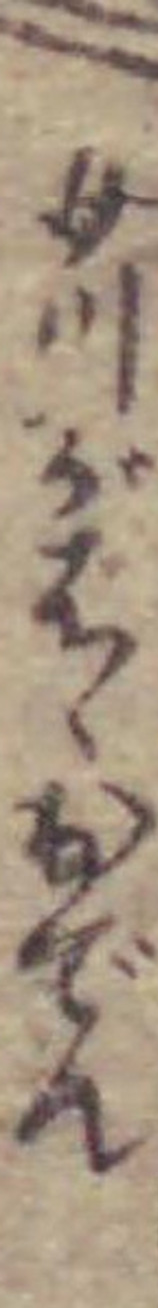女川がはゝおでん
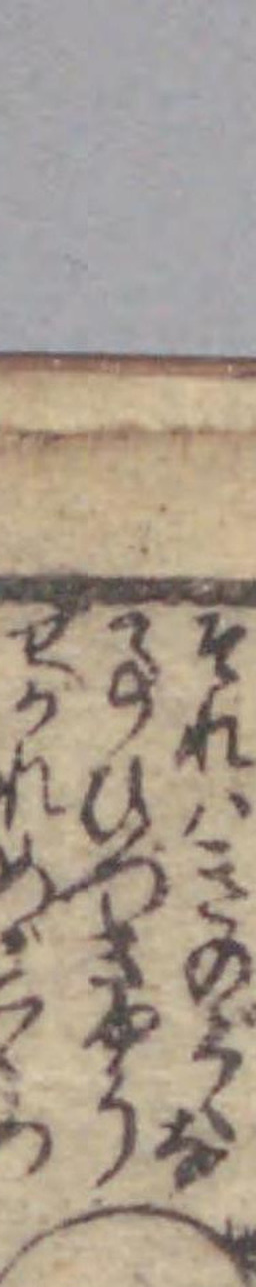事ひつきやう
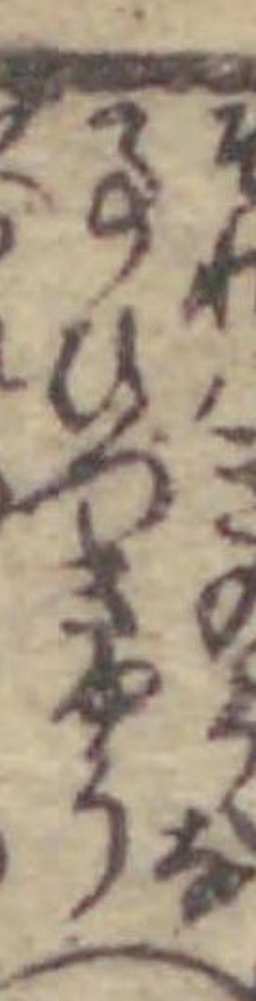事ひつきやう
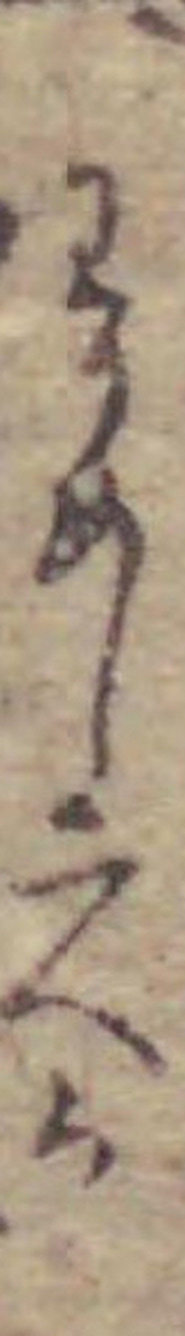わりめし二人か
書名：諸事米の飯 : 3巻
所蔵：国立国会図書館 National Diet Library, JAPAN
